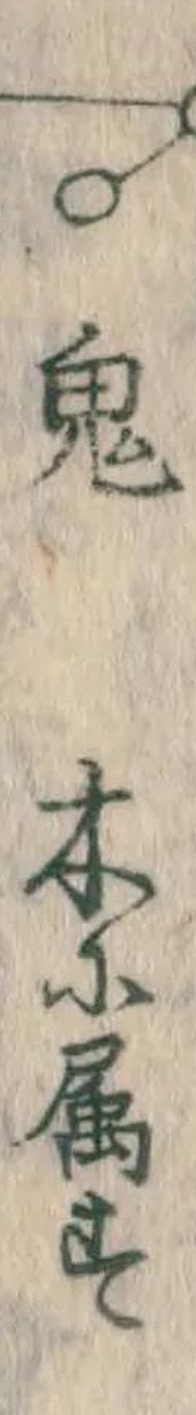鬼木に属す
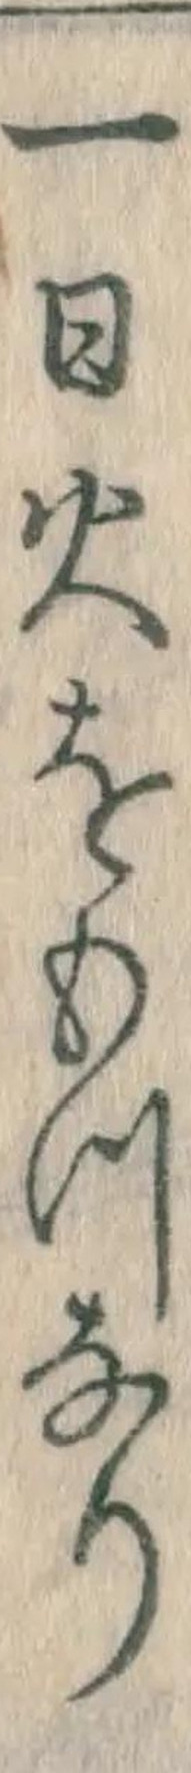一日火をもつなり
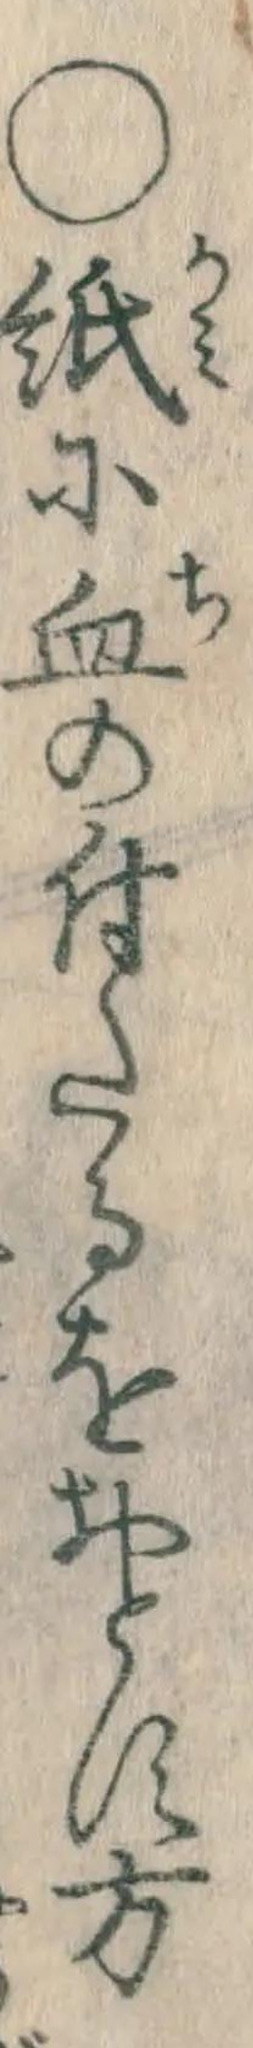○紙に血の付たるをおとす方
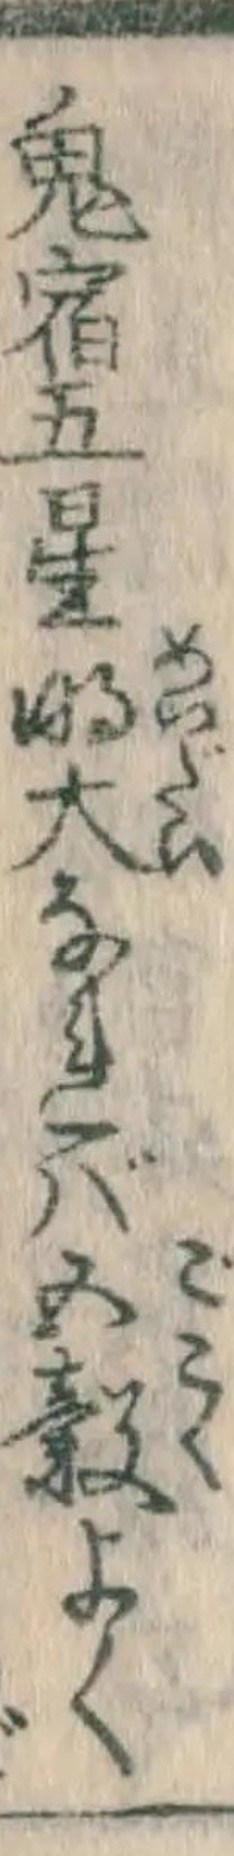鬼宿五星明大なれば五穀よく
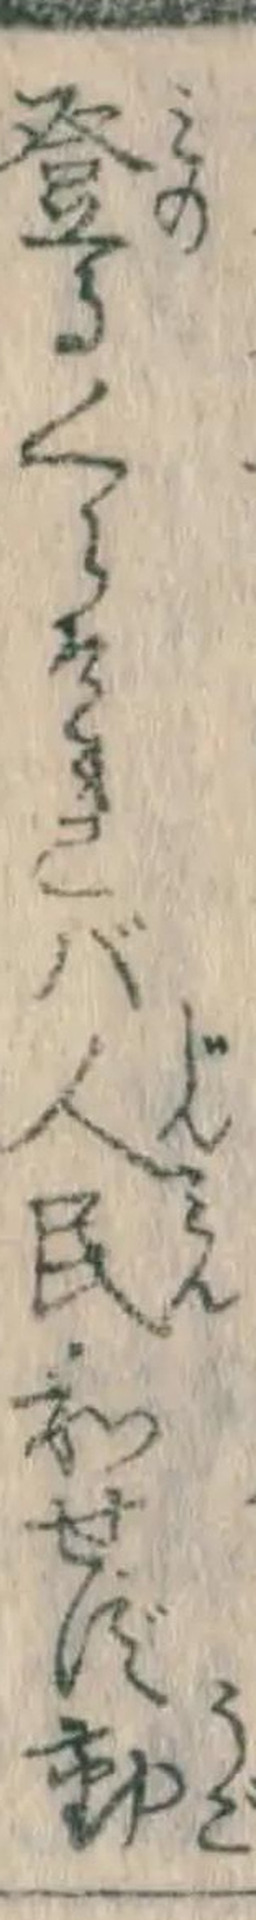登るくらければ人民和せず動
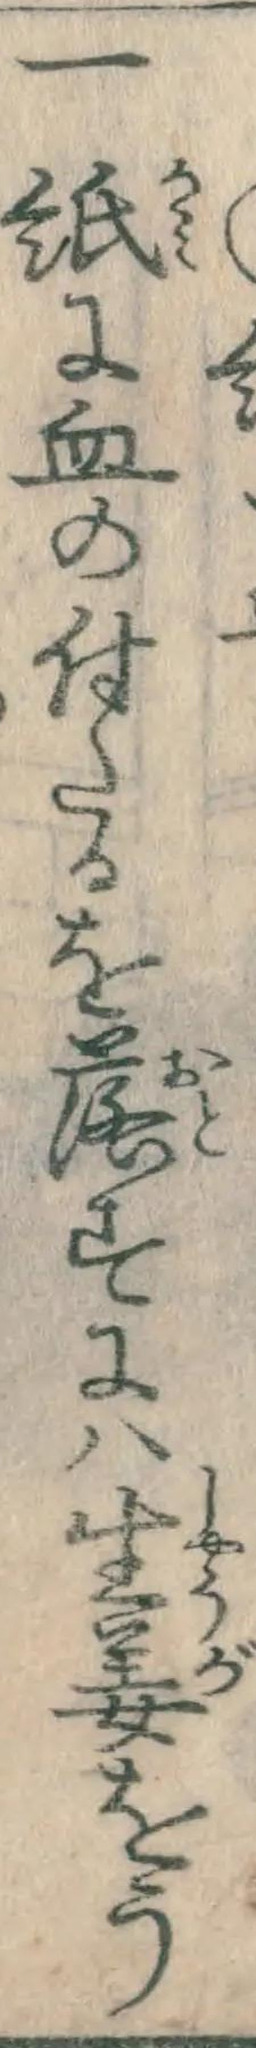一紙に血の付たるを落すには生姜をう
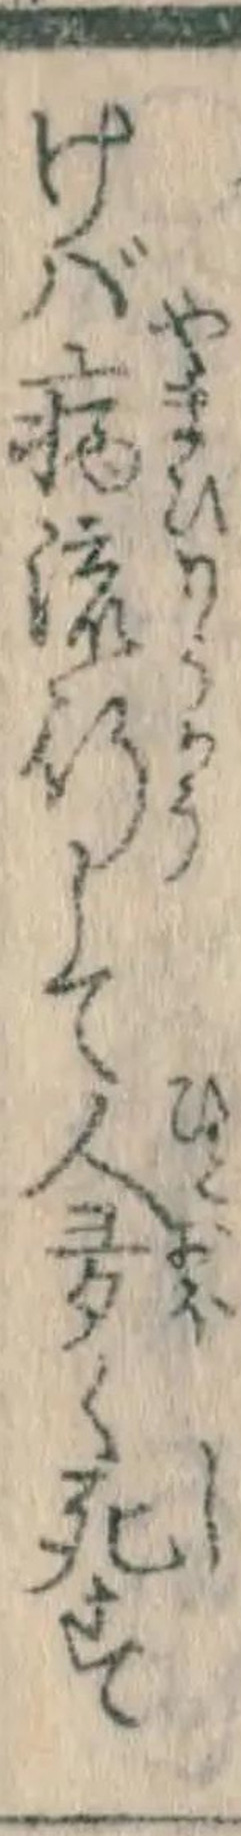けば病流行して人多く死す
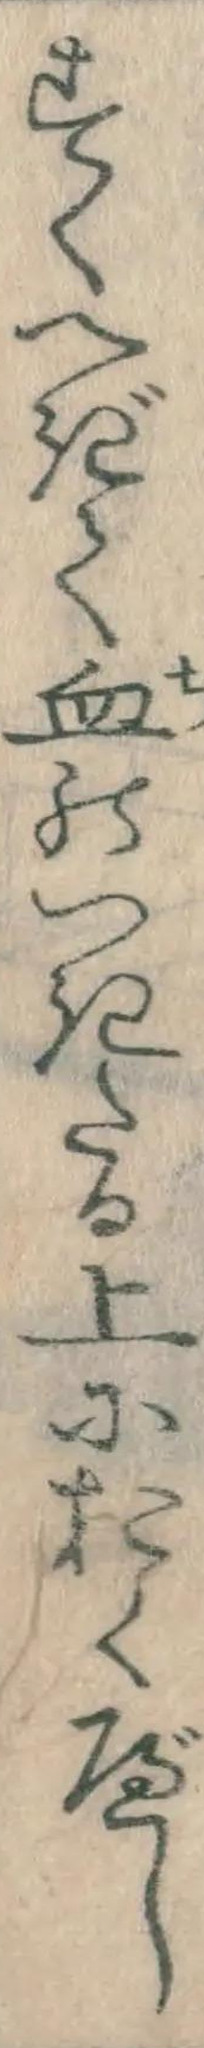すくへぎて血のつきたる上におくべし

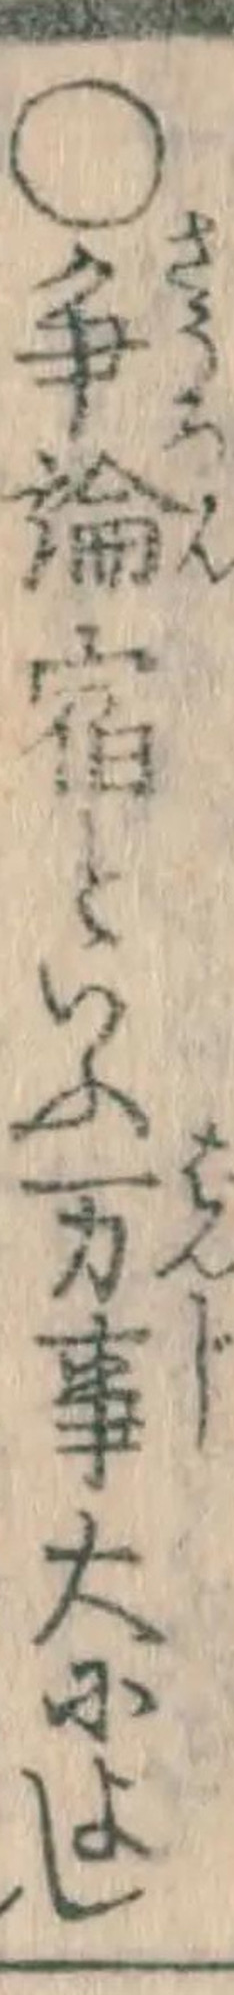○争論宿といふ万事大によし
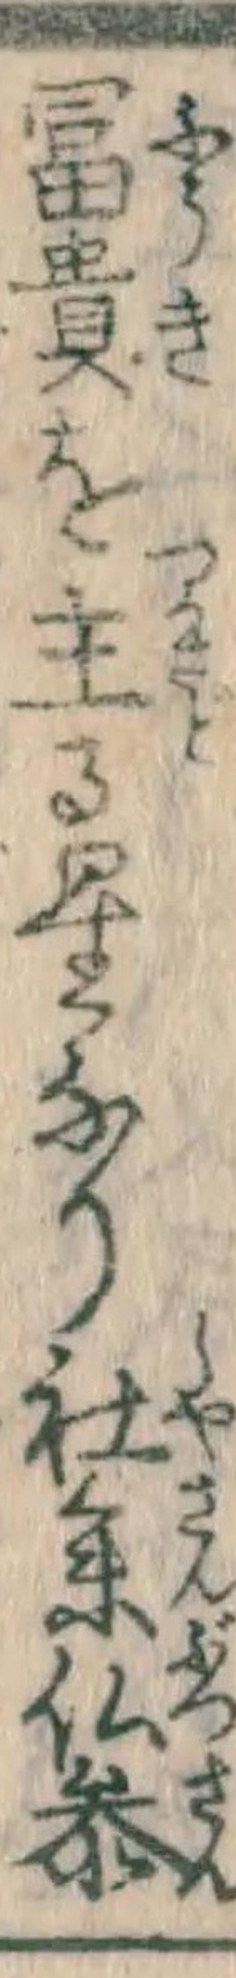富貴を主る星なり社参仏参
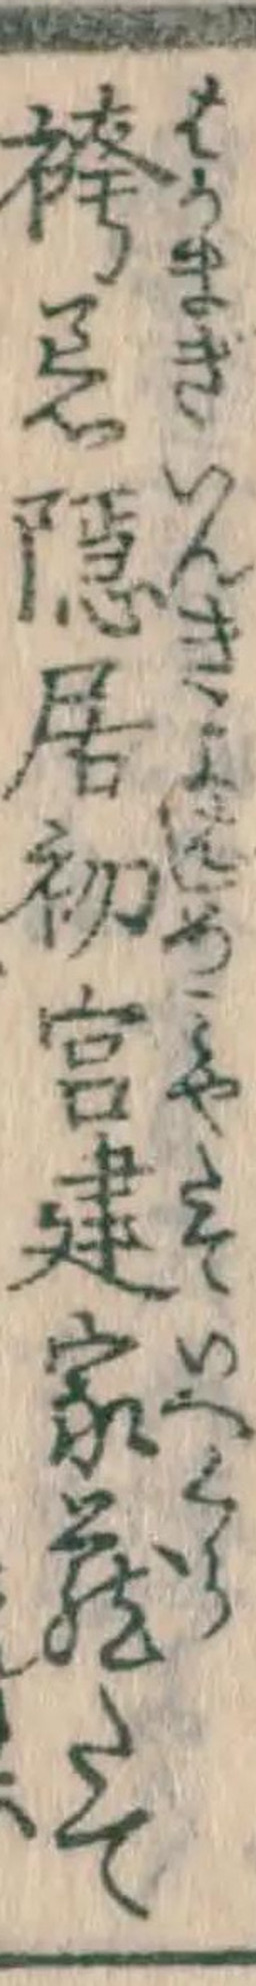袴着隠居初宮建家蔵たて
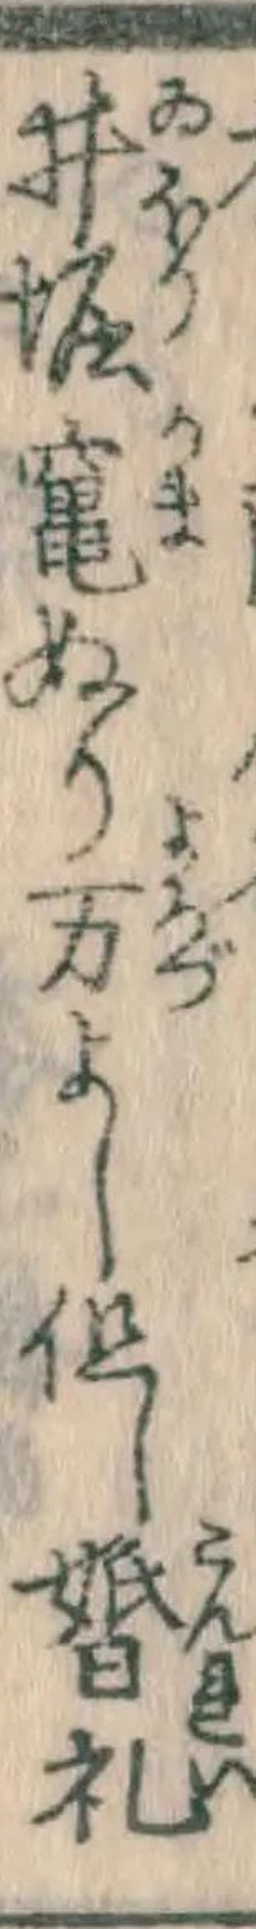井掘竈ぬり万よし但し婚礼
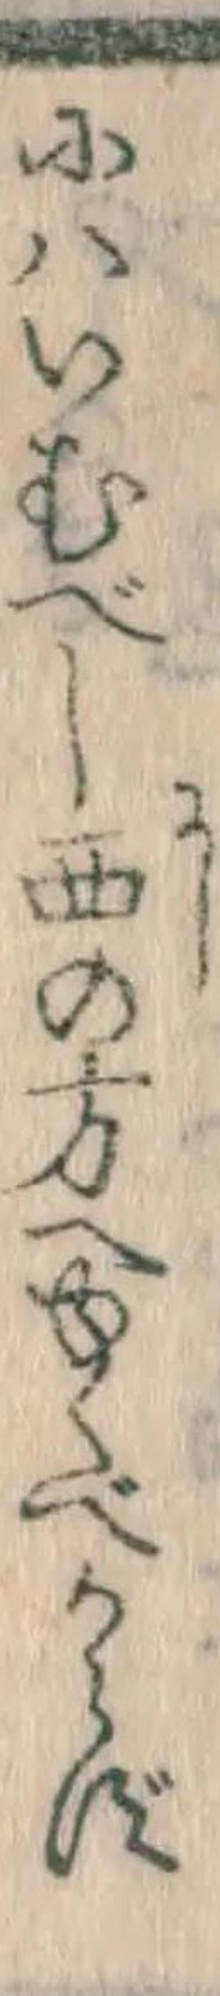にはいむべし西の方へゆくべからず
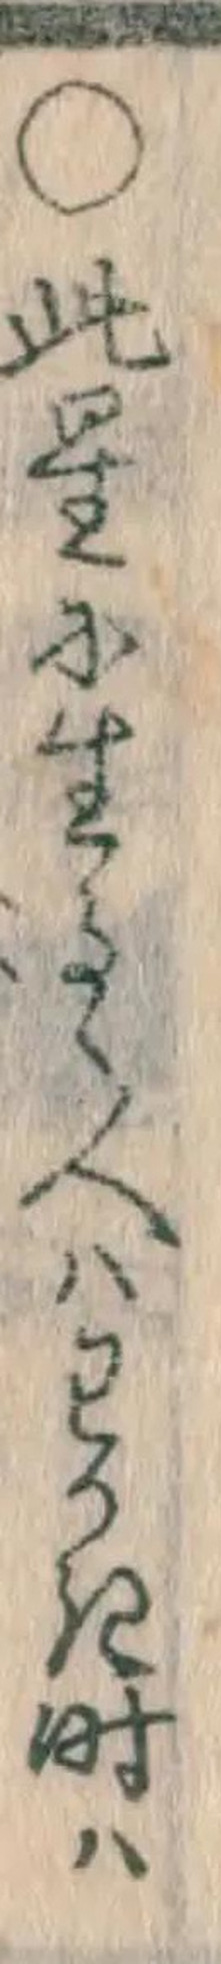○此星に生るゝ人はわかき時は
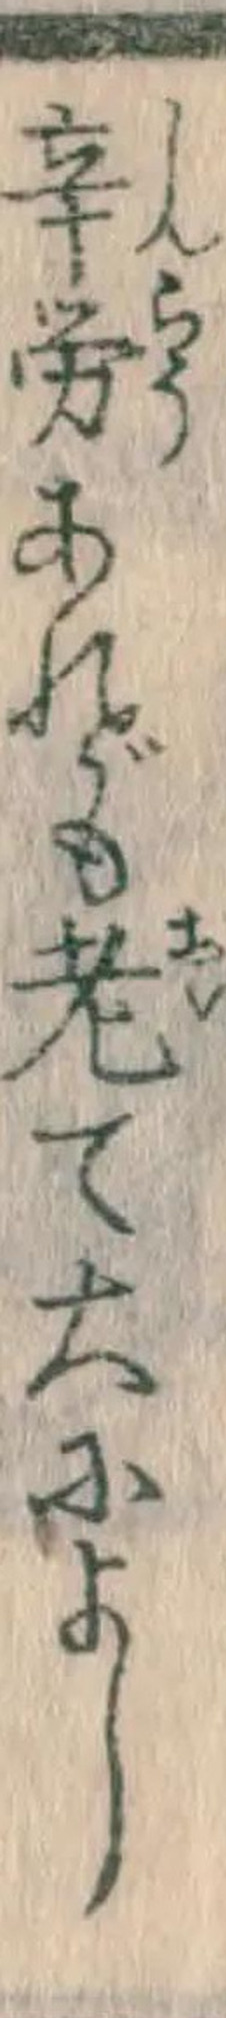辛労あれども老て大によし
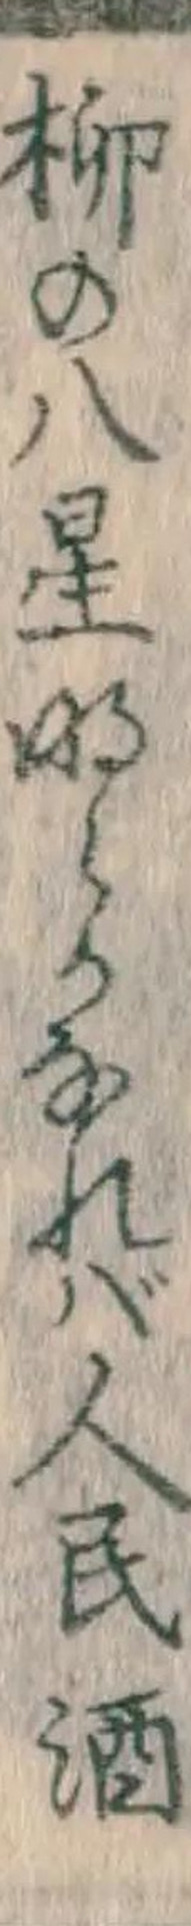柳の八星明らかなれば人民酒
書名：広益秘事大全 3巻. [2]
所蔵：国立国会図書館 National Diet Library, JAPAN
